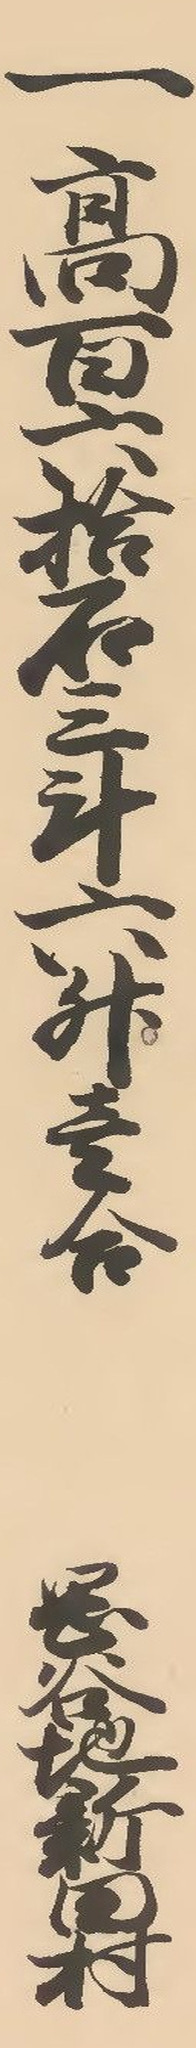一高百六拾石三斗六升壱合岡谷地新田村
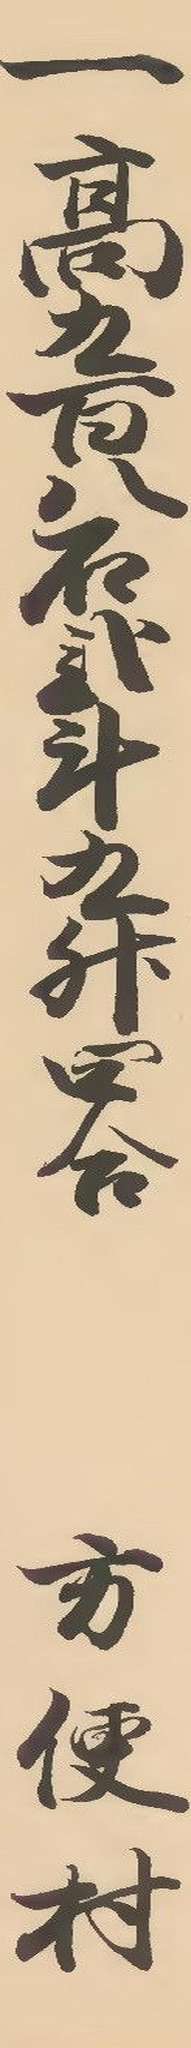一高九百八石弐斗九升四合方便村
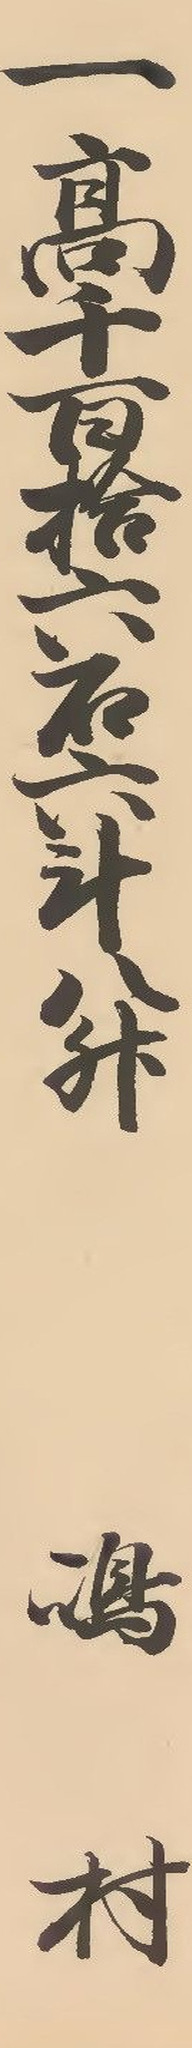一高千百拾六石六斗八升島村
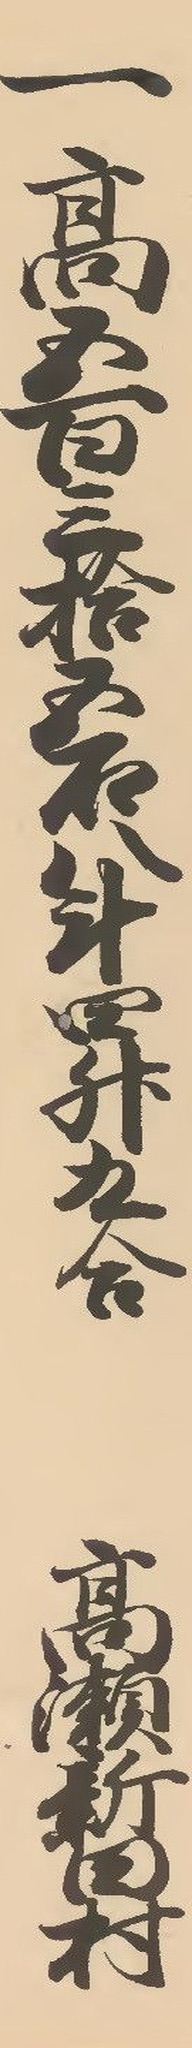一高五百三拾五石八斗四升九合高瀬新田村
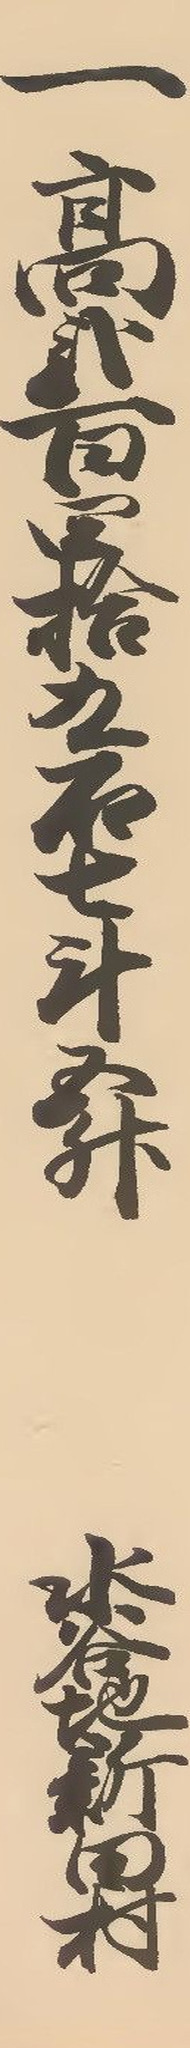一高弐百四拾九石七斗五升水谷地新田村
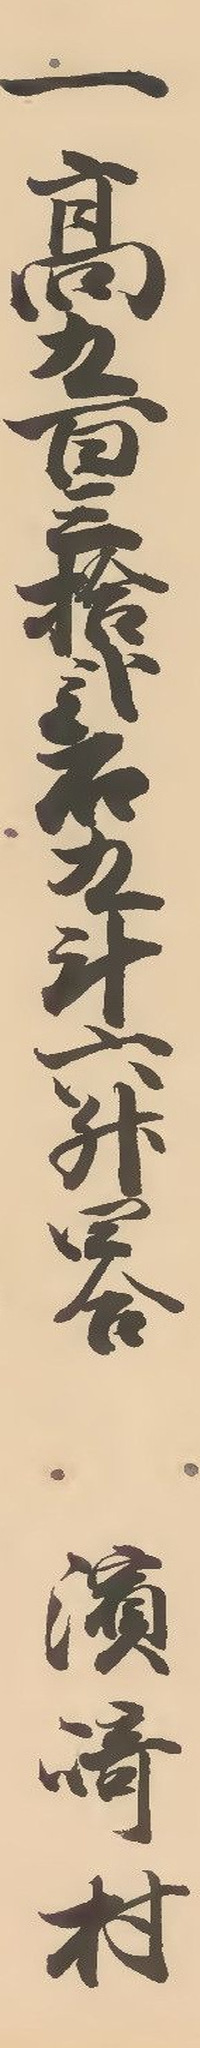一高九百三拾弐石九斗六升四合浜崎村

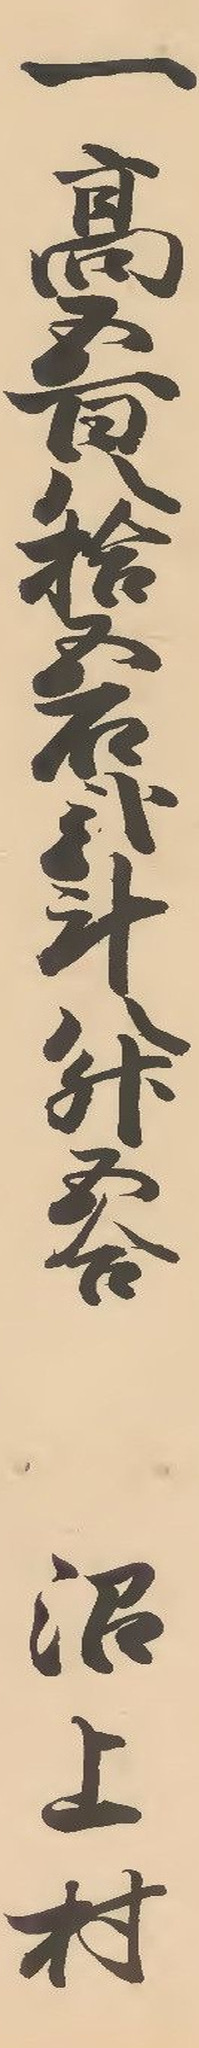一高五百八拾五石弐斗八升五合沼上村
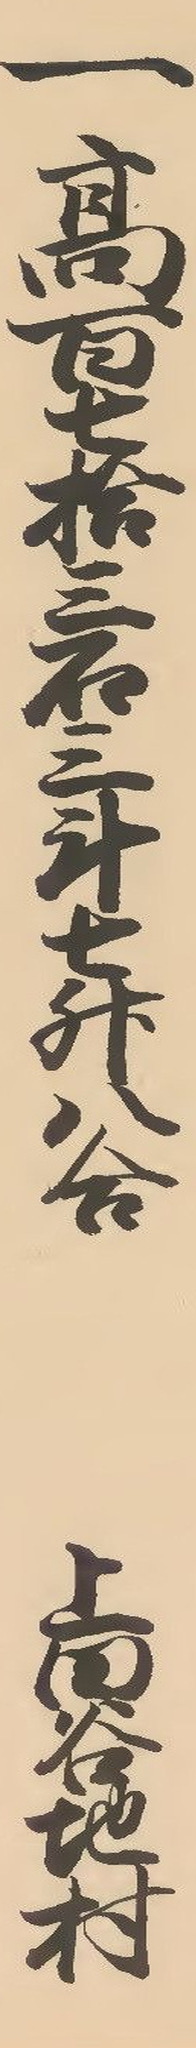一高百七拾三石三斗七升八合上田谷地村
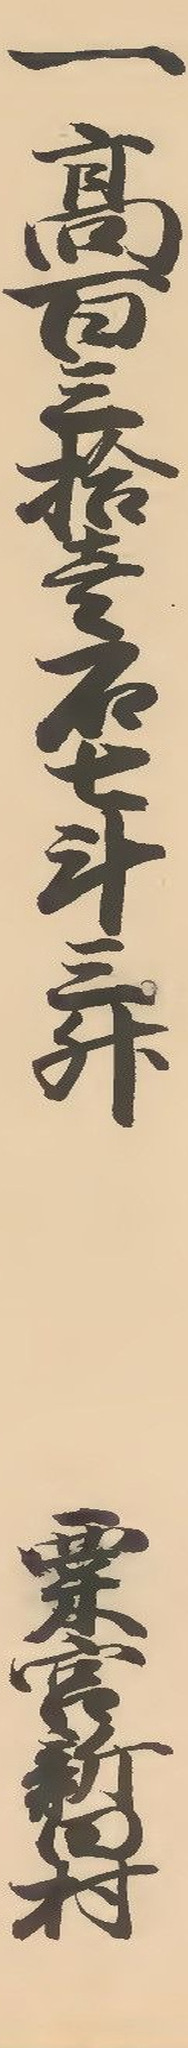一高百三拾壱石七斗三升栗宮新田村
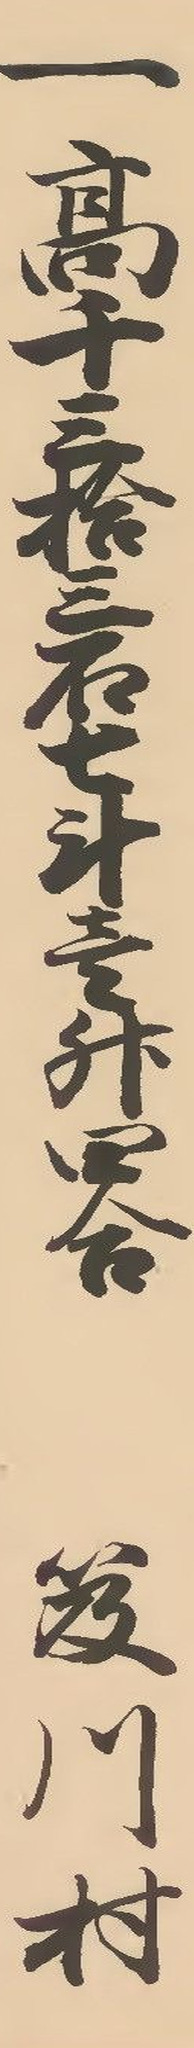一高千三拾三石七斗壱升四合笈川村
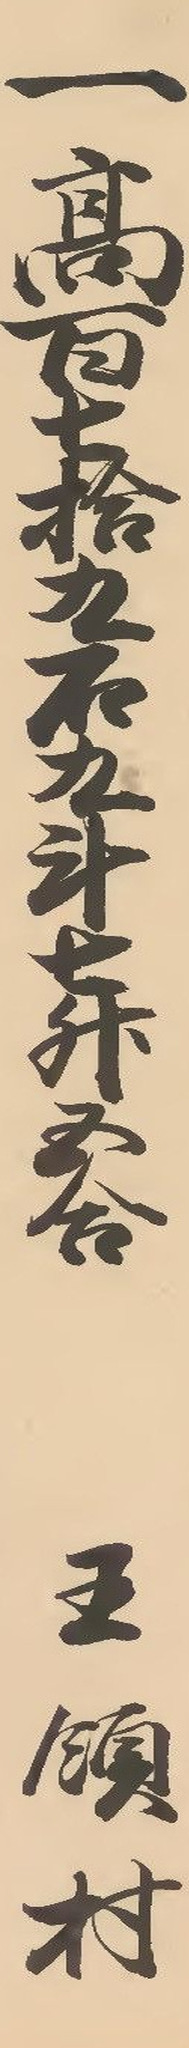一高百七拾九石九斗七升五合王領村
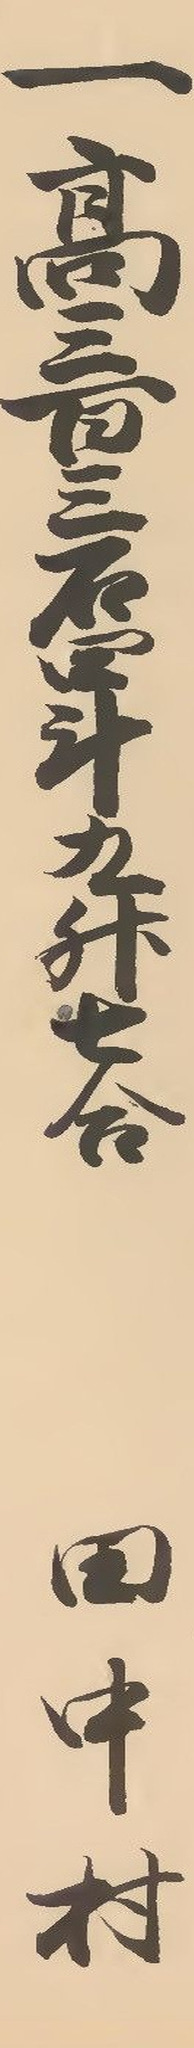一高三百三石四斗九升七合田中村
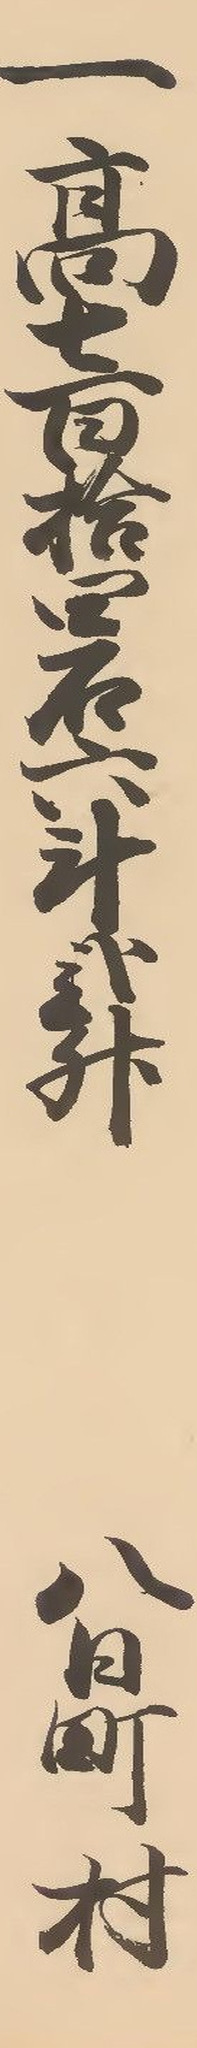一高七百拾四石六斗弐升八日町村
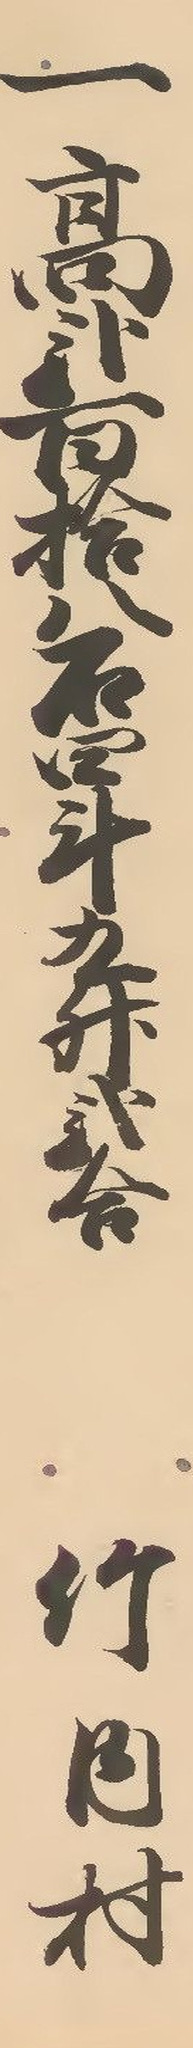一高弐百拾八石四斗九升弐合竹内村

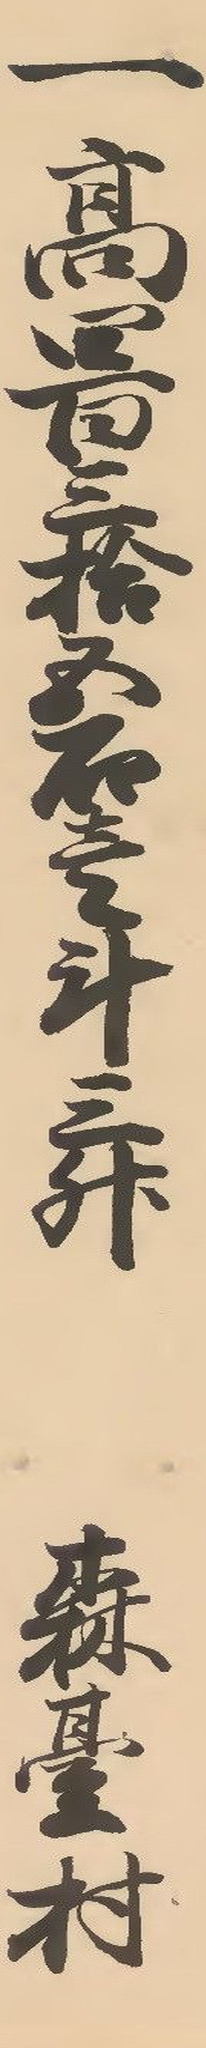一高四百三拾五石壱斗三升森台村
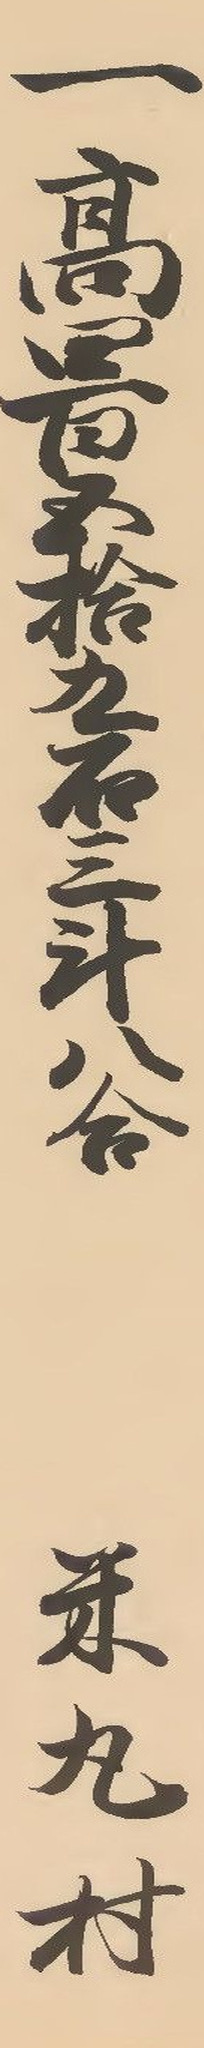一高四百五拾九石三斗八合米丸村
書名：陸奥国郷帳　１
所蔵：国立公文書館 National Archives of Japan
